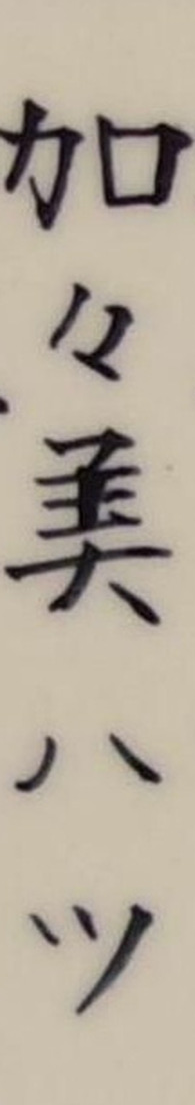加々美ハツ
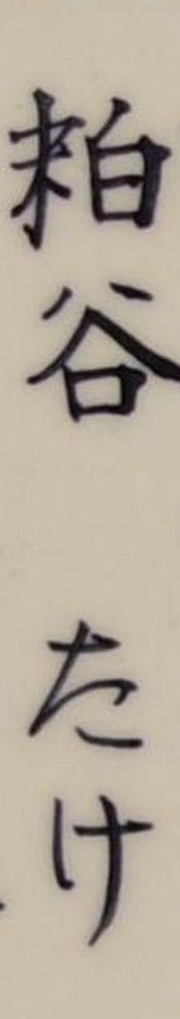粕谷たけ
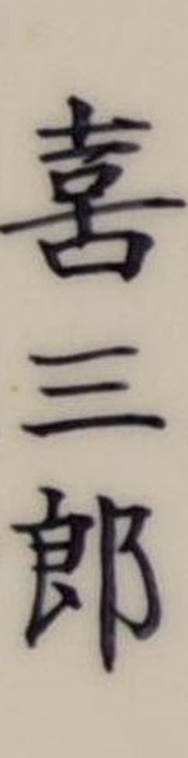喜三郎
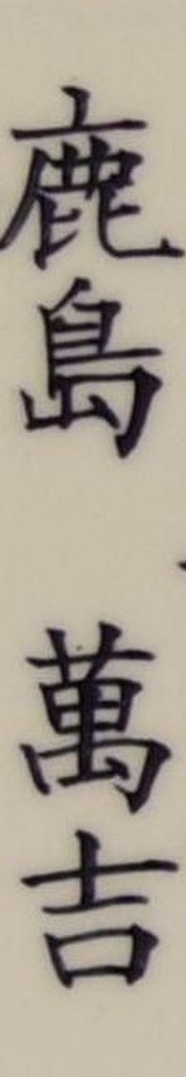鹿島萬吉
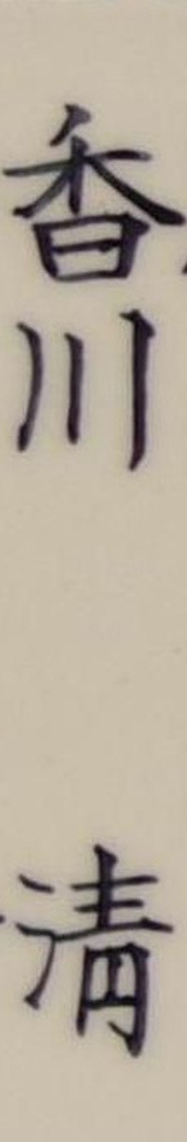香川清
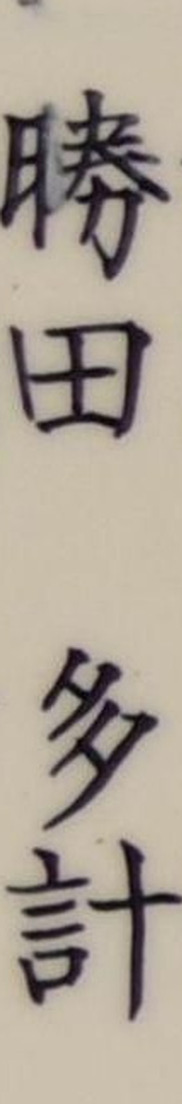勝田多計
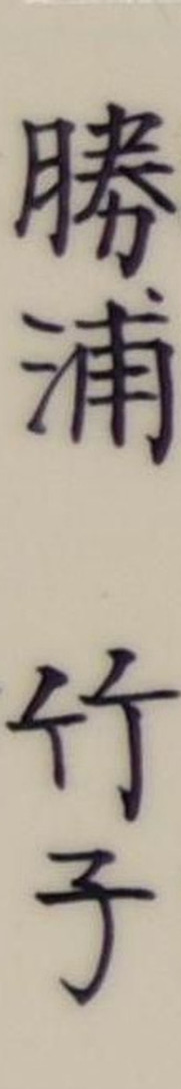勝浦竹子

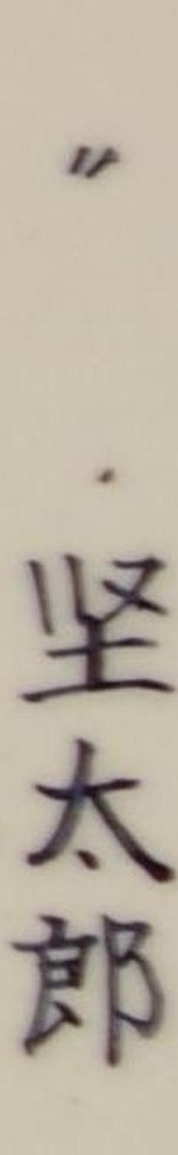堅太郎
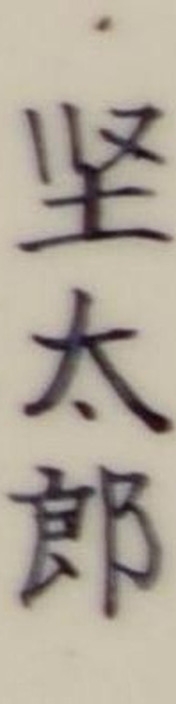堅太郎
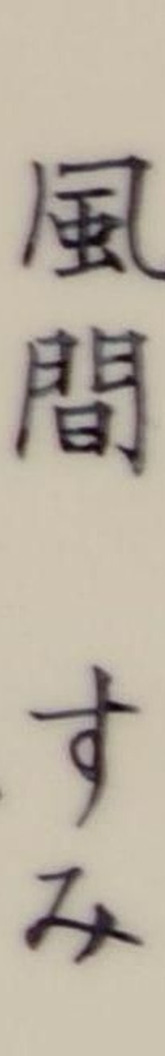風間すみ
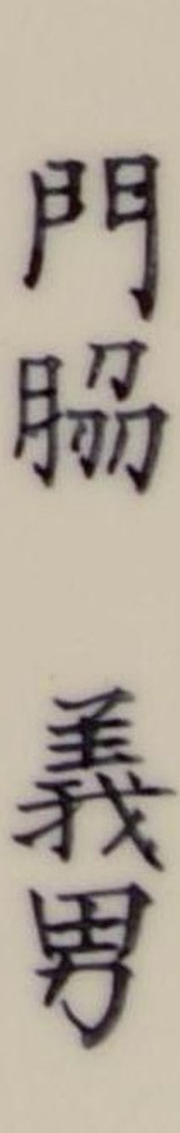門脇義男
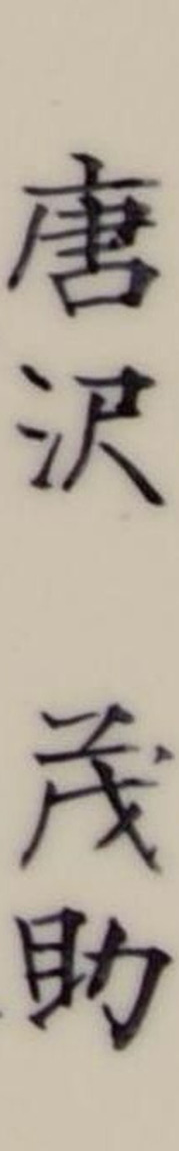唐沢茂助
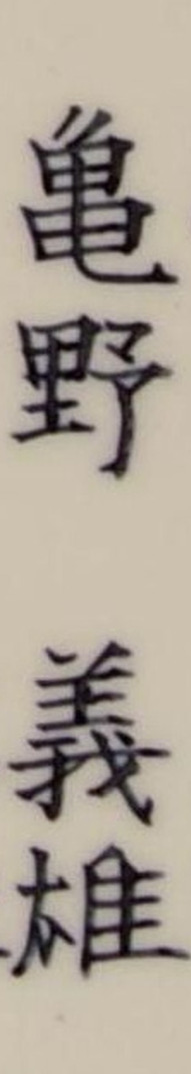亀野義雄
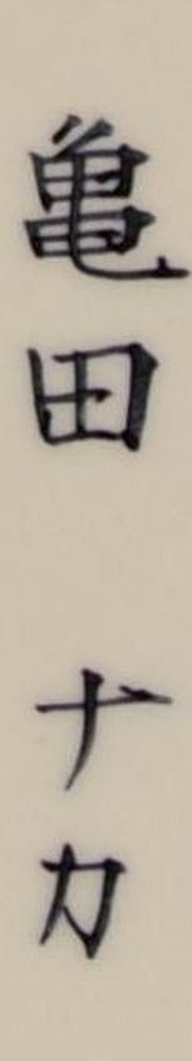亀田ナカ
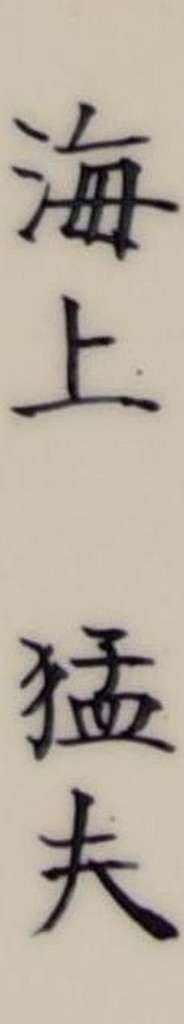海上猛夫
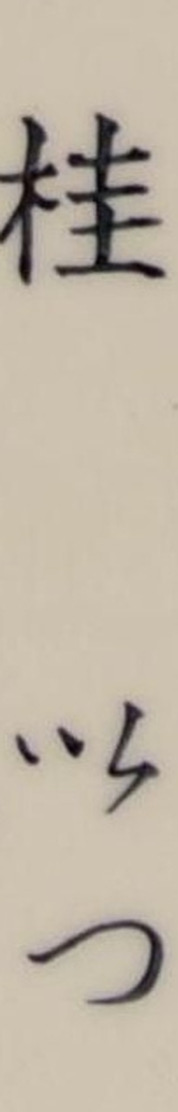桂いつ
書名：E~L
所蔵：高野山金剛峯寺
